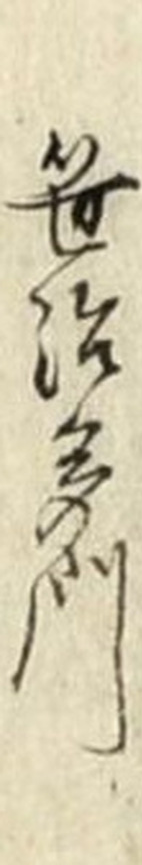笹治多門
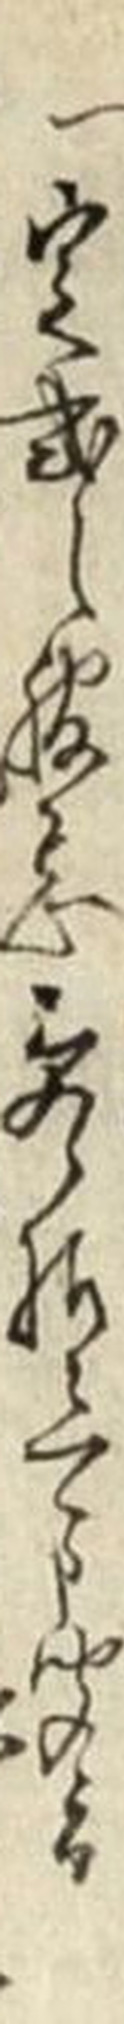定式之服忌受候様ニ可申聞旨
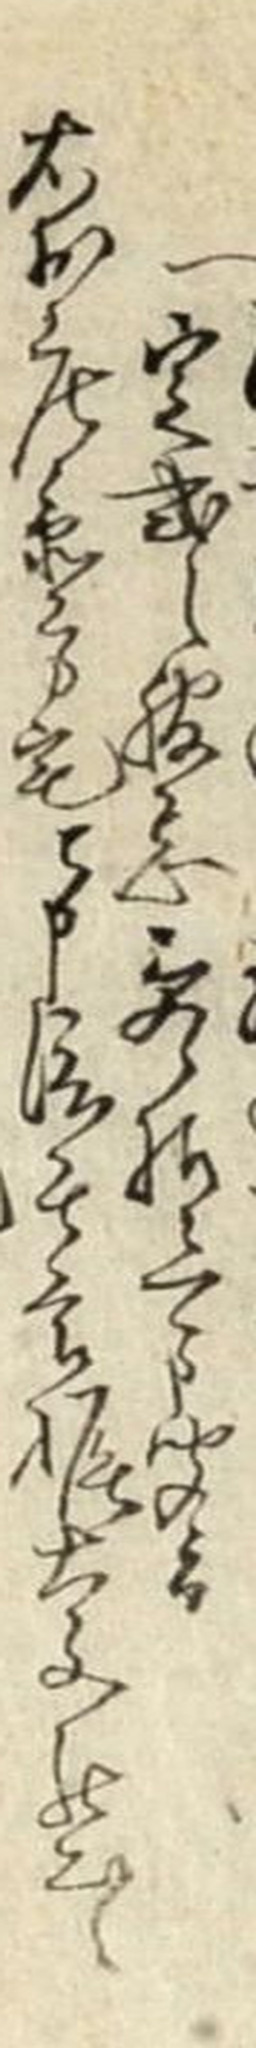右於庄兵衛方宅被申渡其節大夫罷出之
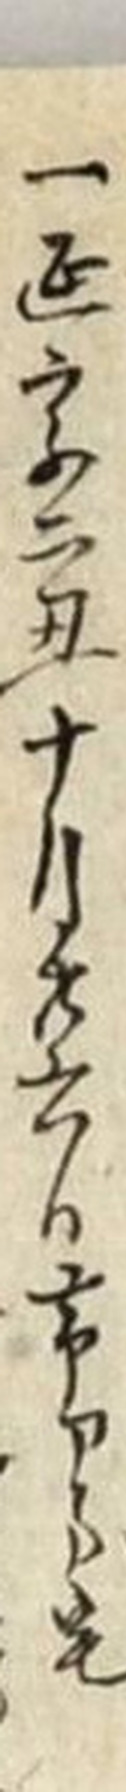一延享ニ丑十月廿六日帯刀方宅
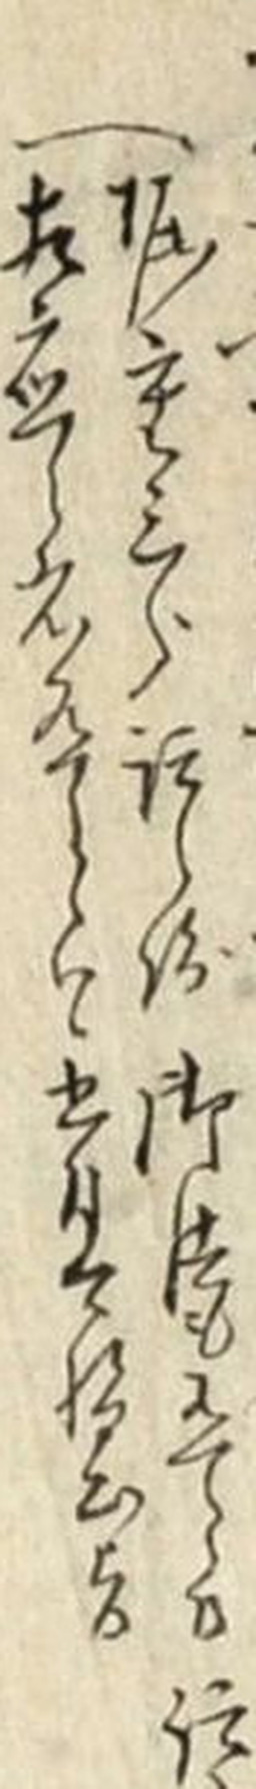相応之者有之候ハヽ書付可指出旨
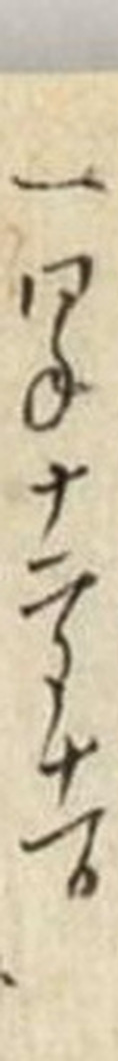一同年十二月十一日
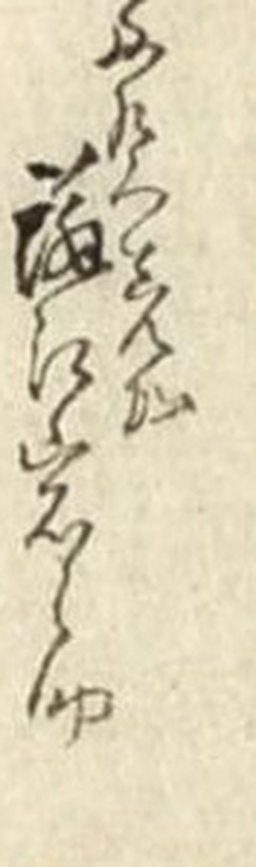蟹江岩之助
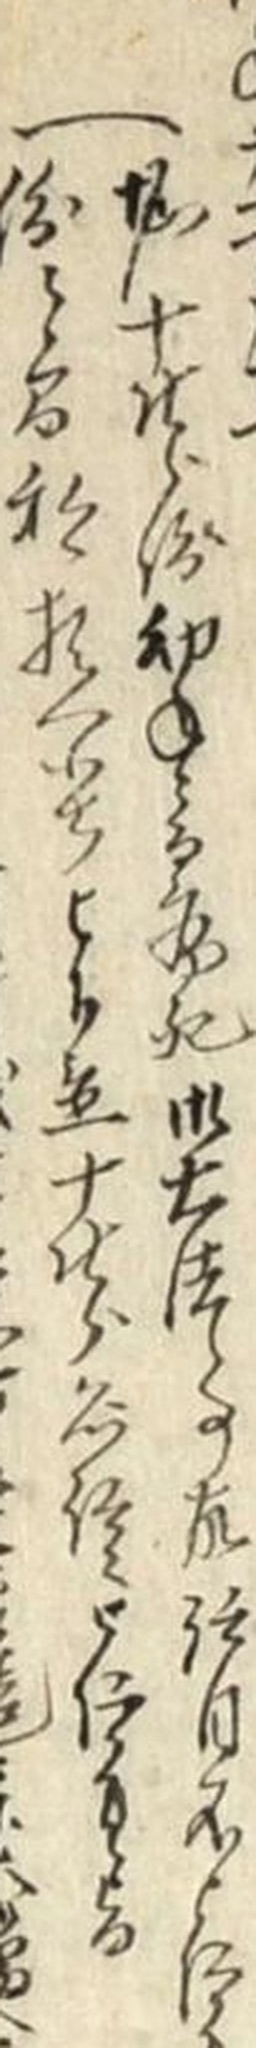儀ニ候間私へ拾人扶持被下置十次郎名跡ニ被仰付候旨

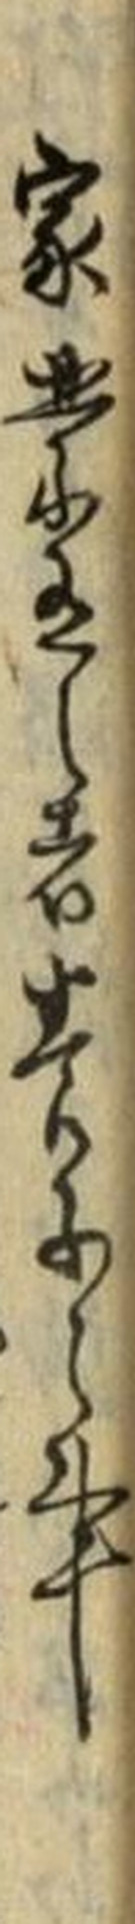家業有之者養子之事
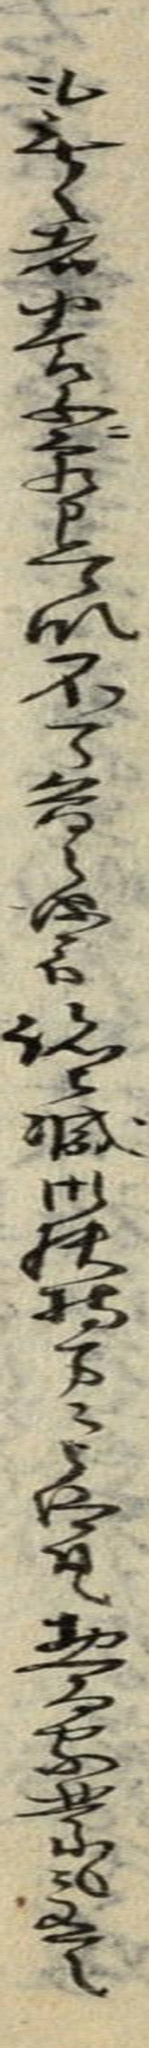も無之者養子ニ願申上候段不了簡之儀ニ付跡被減御扶持方ニ被仰付候惣而家業も有之
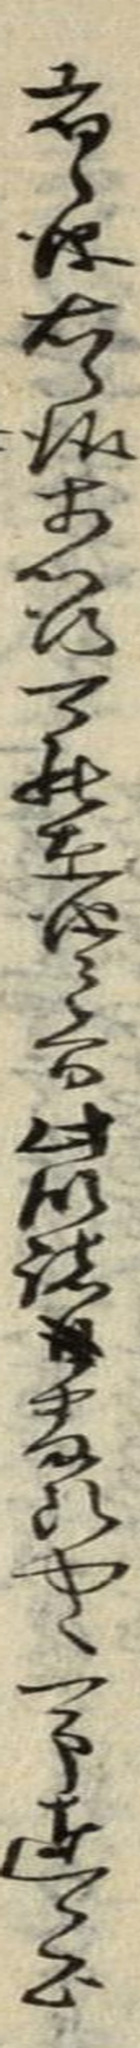者之儀右之趣相心得可罷在儀ニ候間此段諸番頭中へ可申達候以上
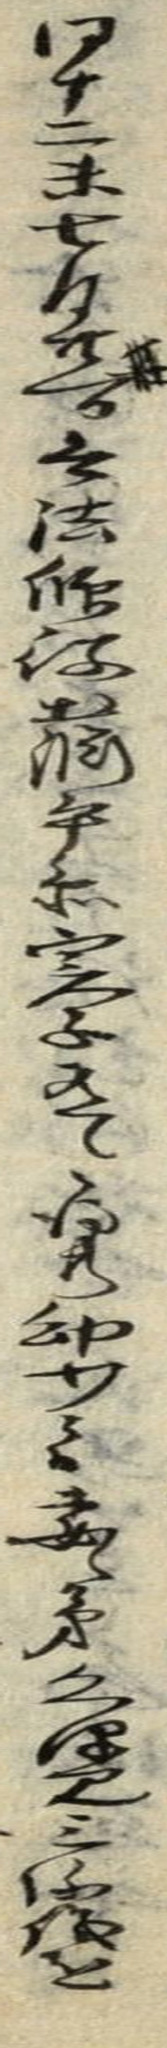一同十二未七月廿一日兵法師役出淵平兵衛実子有之候得共幼少ニ而妻之弟久津見三弥儀を
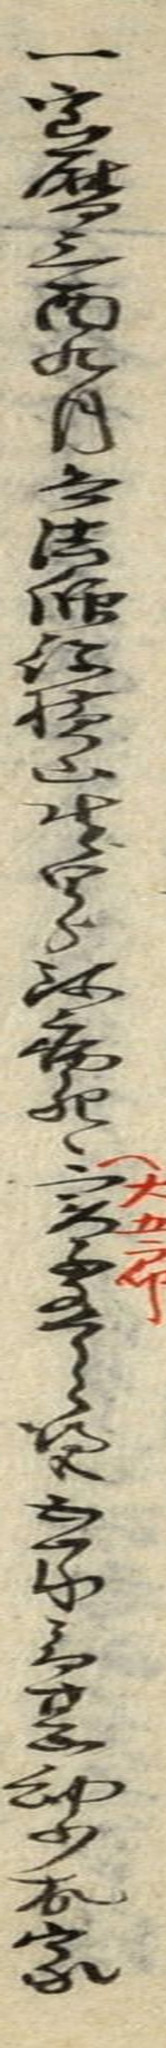一宝暦三酉九月兵法師役横山次郎四郎致病死候実子有之候得共五歳に而甚幼少故家
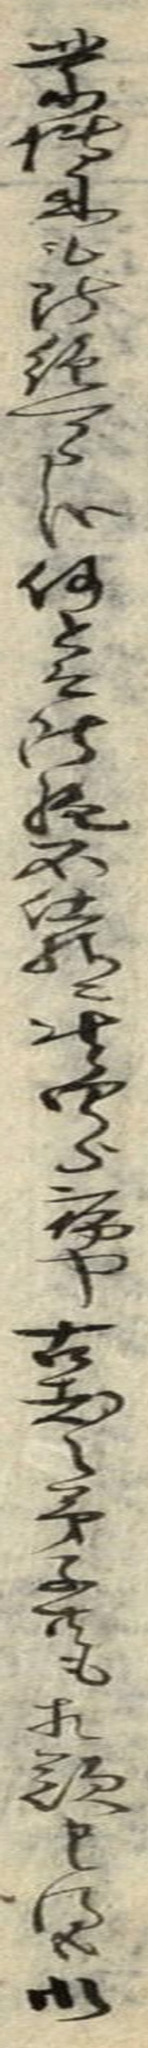業伝来も断絶可申哉何とそ断絶不仕様に次郎四郎病中古老之弟子共も相歎申候得共御
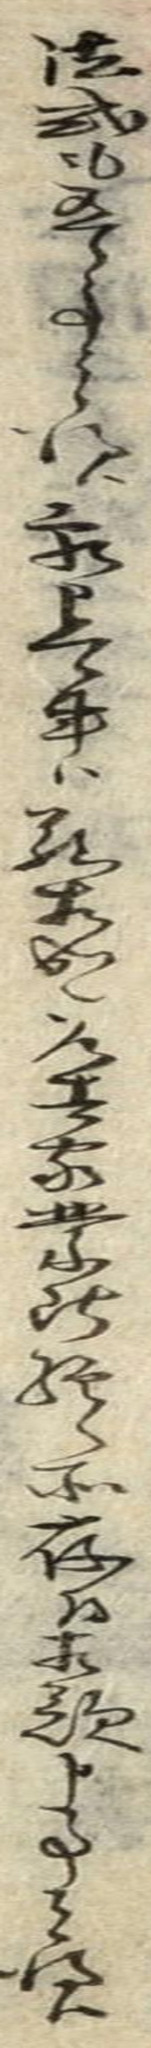法式も有之事に候得は願申上候事は難相成候乍去家業断絶之所存付相歎申事に候得は
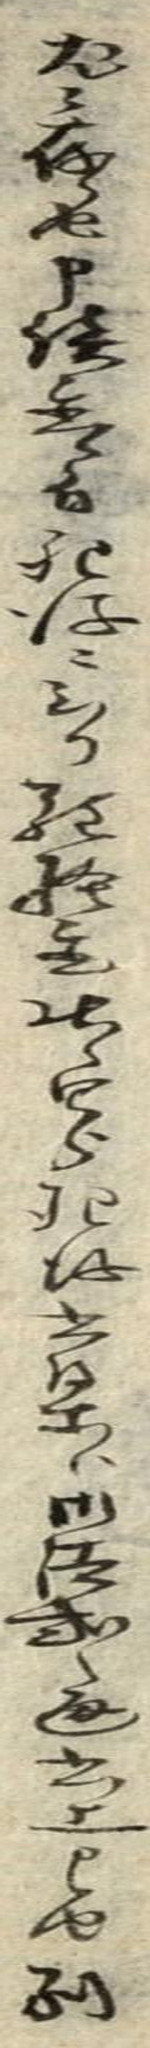尤に存候由申談置候に付死後に至り難捨置次郎四郎死後書付等は御法式之通書上申候由別
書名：養子縁組之部
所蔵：福井県文書館 Fukui Prefectural Archives
